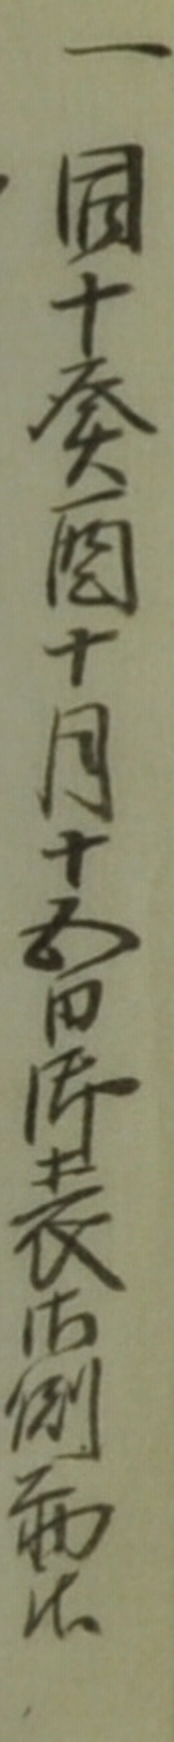一同十癸酉十月十五日御表御側勤被
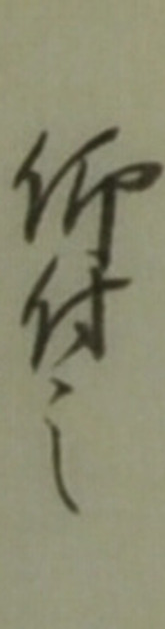仰付之
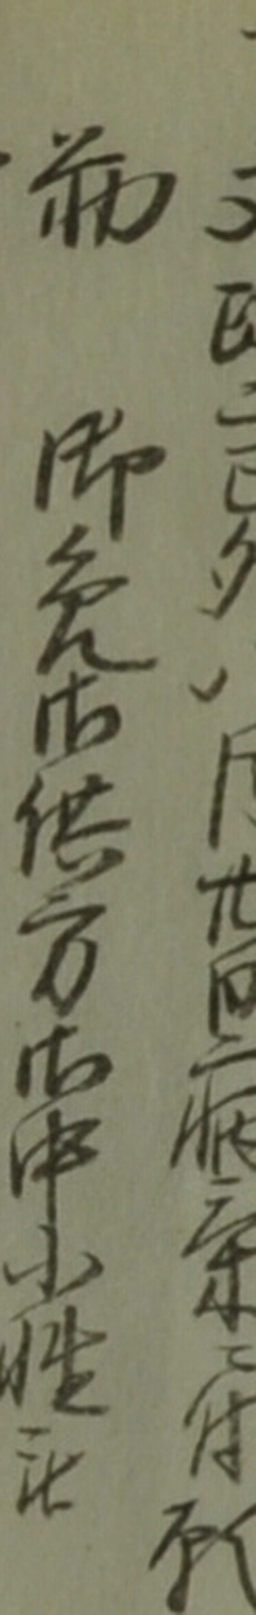勤御免御供方御中小性被
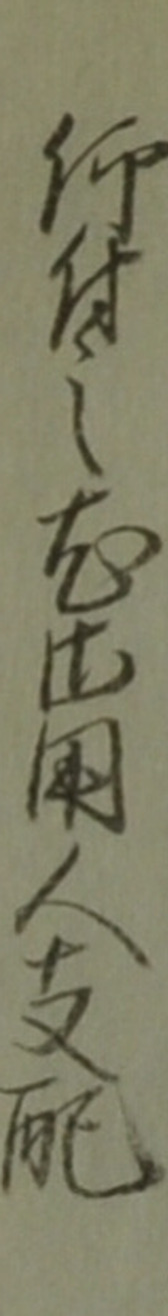仰付之尤御用人支配
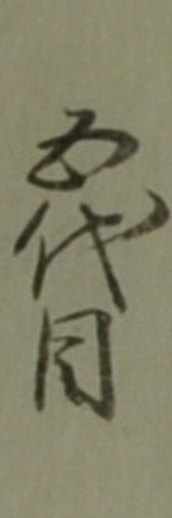五代目
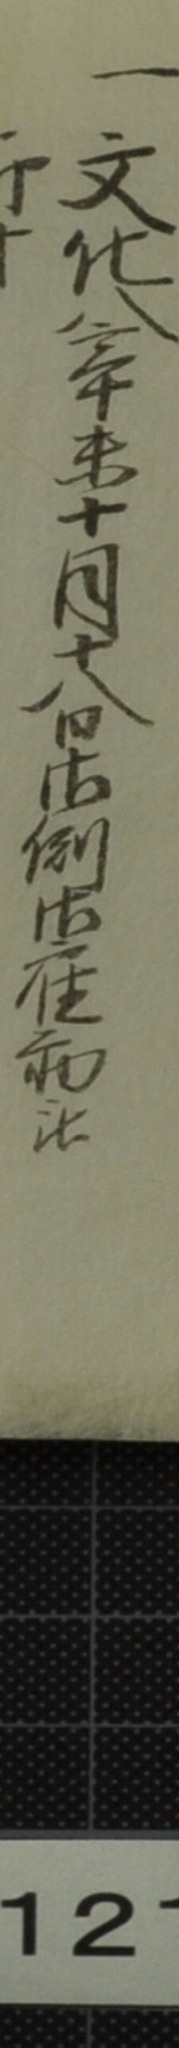一文化八辛未十月十八日御側御雇勤被
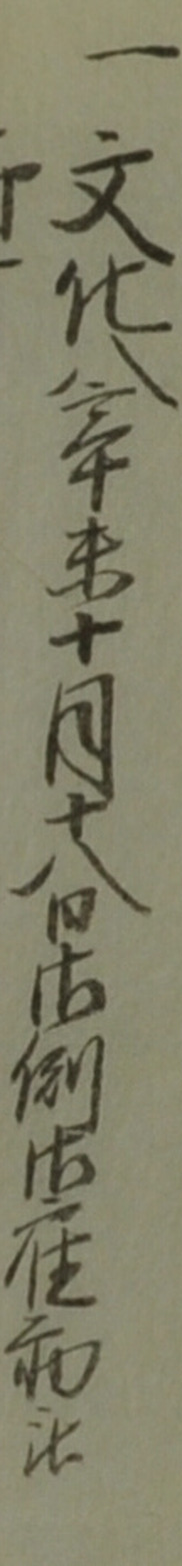一文化八辛未十月十八日御側御雇勤被
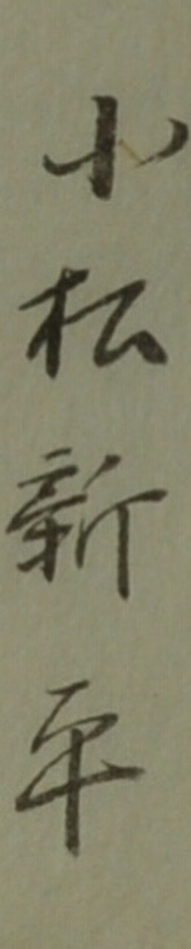小松新平
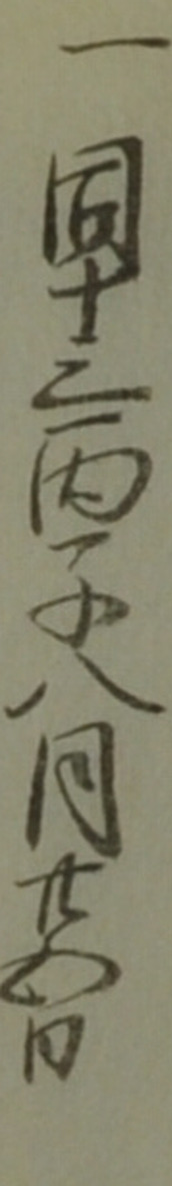一同十三丙子八月廿五日
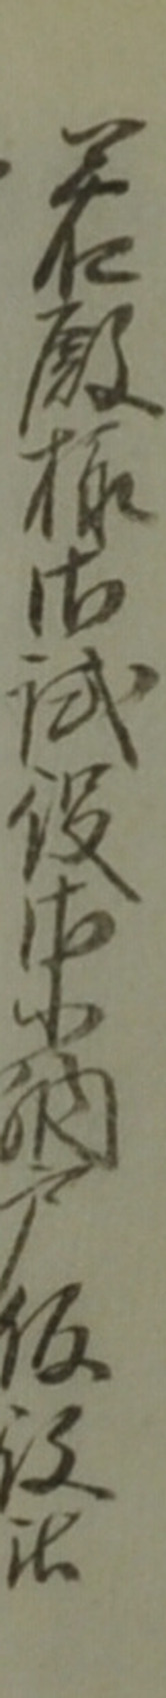若殿様御試役御小納戸仮役被
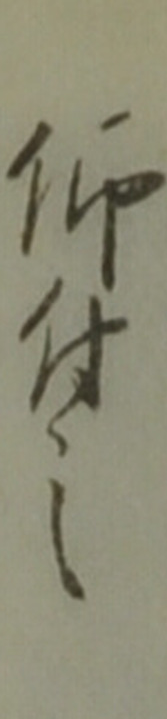仰付之
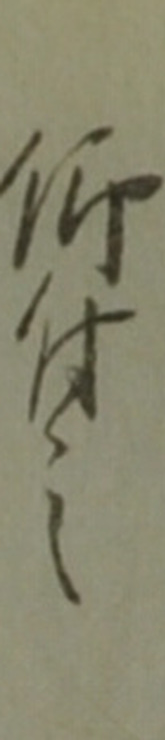仰付之
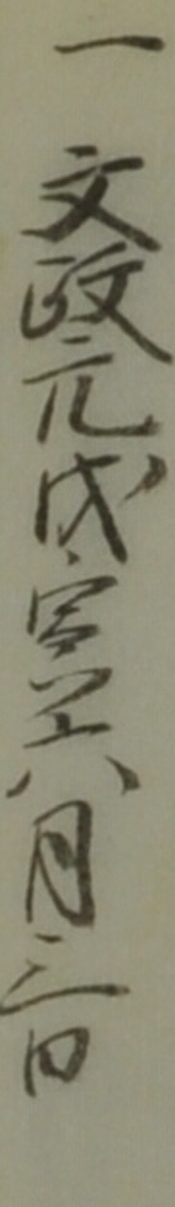一文政元戊寅六月三日
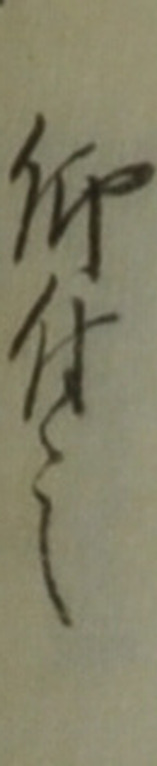仰付之
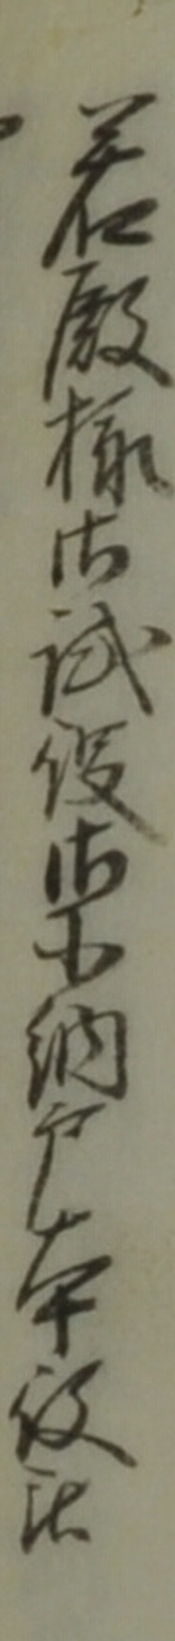若殿様御試役御小納戸本役被
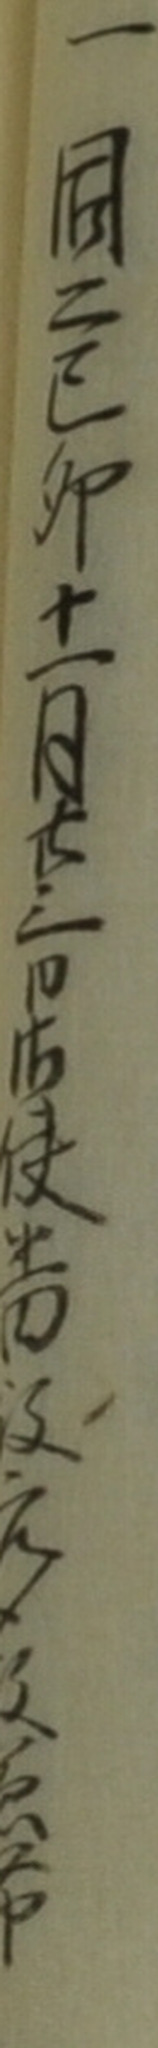一同二己卯十一月廿三日御使番役元〆役兼帯
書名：諸御役代々録（五）
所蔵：伊那市立高遠町図書館・合同会社AMANE
